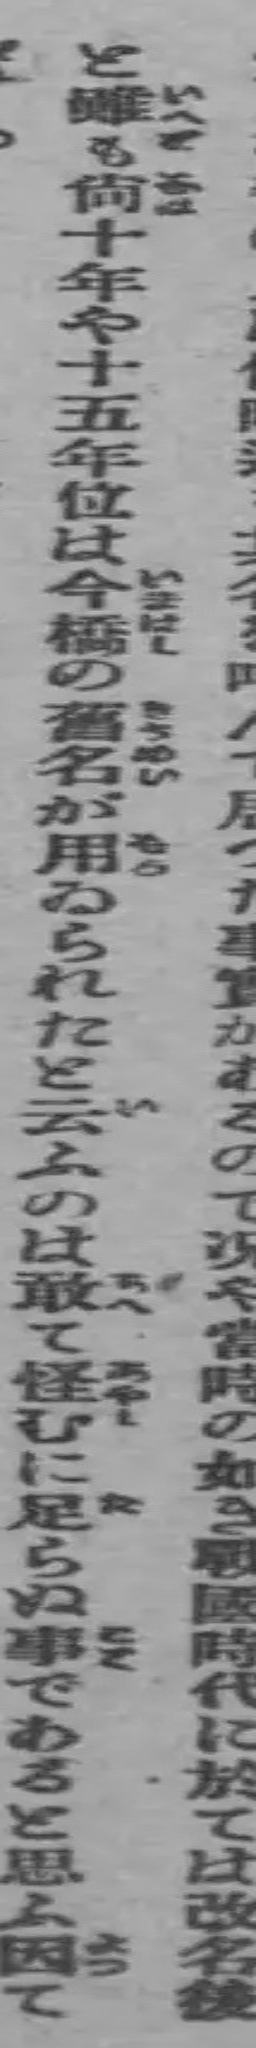と雖も尚十年や十五年位は今橋の旧名が用ゐられたと云ふのは敢て怪むに足らぬ事であると思ふ因て
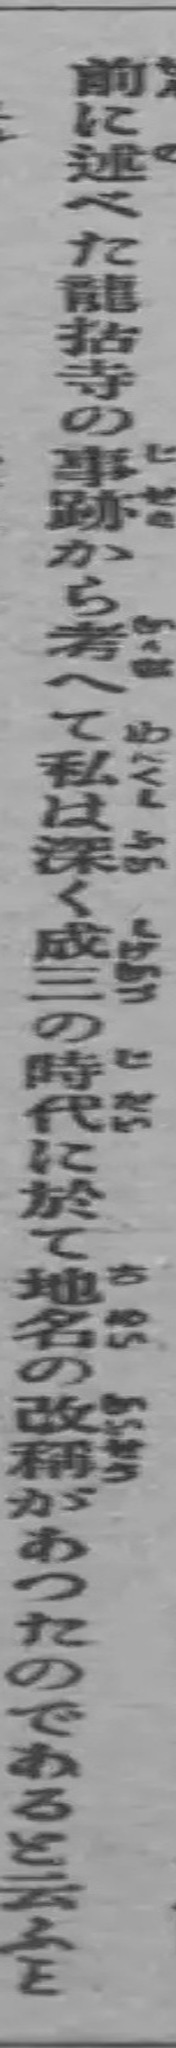前に述べた龍拈寺の事跡から考へて私は深く成三の時代に於て地名の改称があつたのであると云ふこと
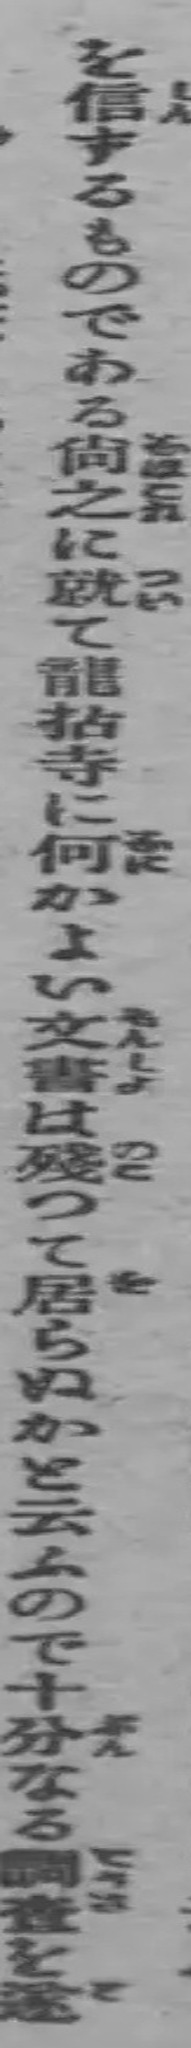を信ずるものである尚之に就て龍拈寺に何かよい文書であるとは残つて居らぬかと云ふので十分なる調査を遂
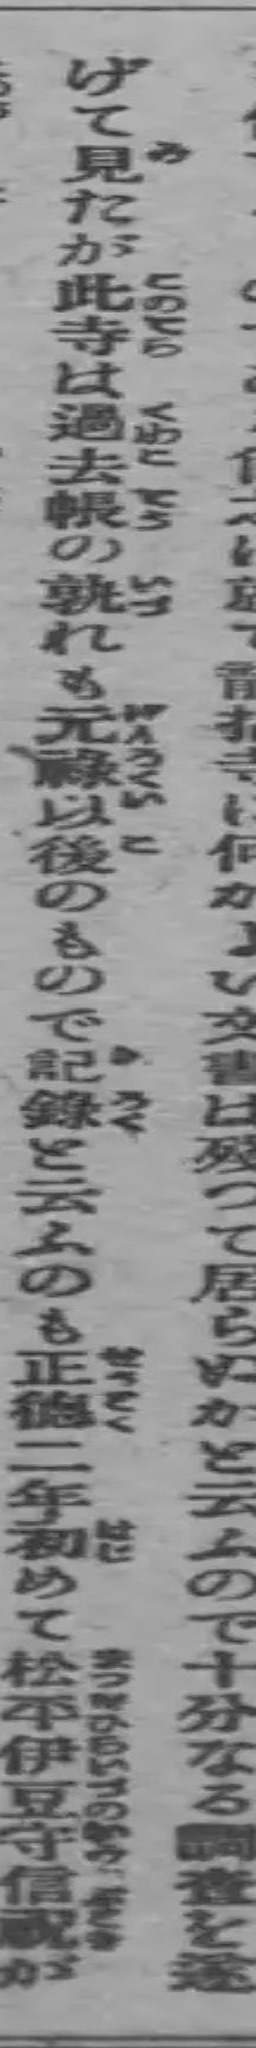げて見たが此寺は過去帳の孰れも元禄以後のもので記録と云ふのも正徳二年初めて松平伊豆守信祝が
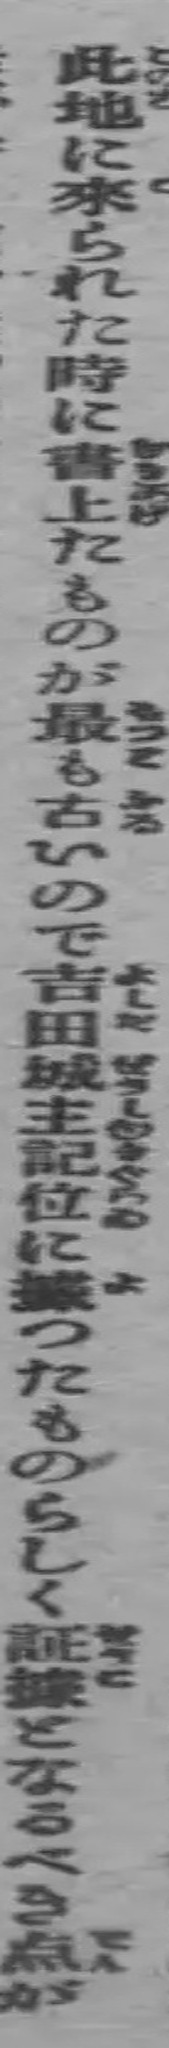此地に来られた時に書上たものが最も古いので吉田城主記位に拠つたものらしく証拠となるべき点が
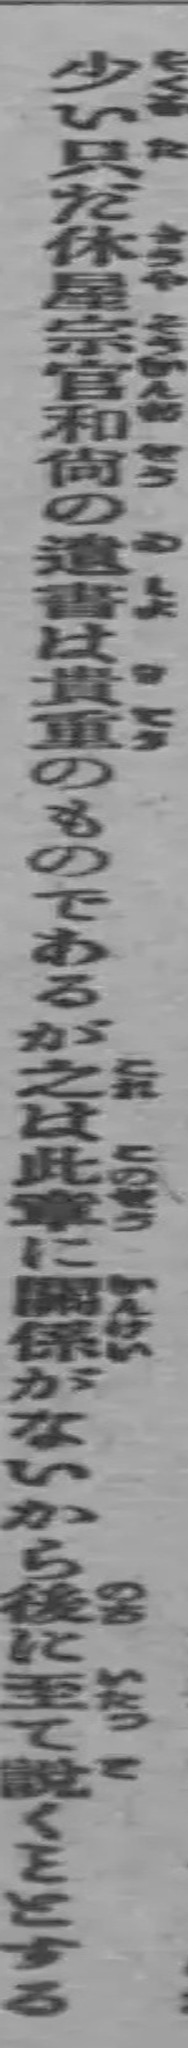少い只だ休屋宗官和尚の遺書は貴重のものであるが之は此章に関係がないから後に至て説くこととする
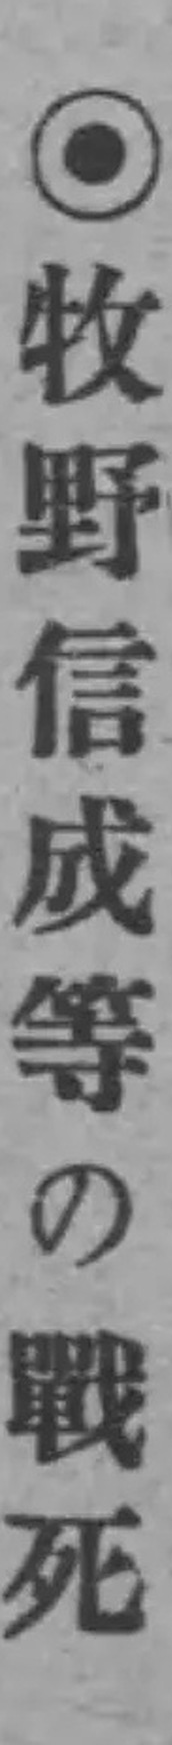⦿牧野信成等の戦死
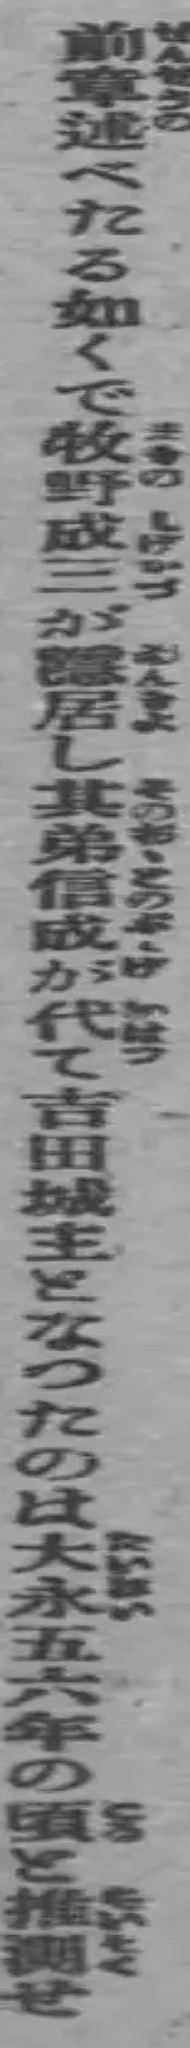前章述べたる如くで牧野成三が隠居し其弟信成が代て吉田城主となつたのは大永五六年の頃と推測せ
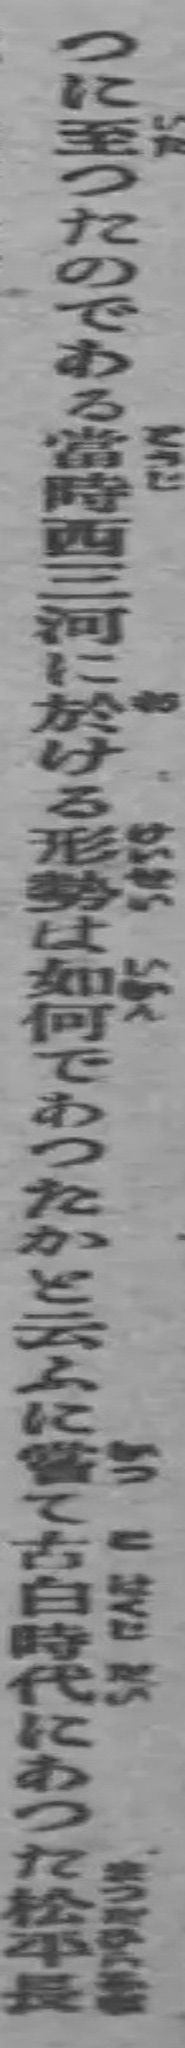つに至つたのである当時西三河に於ける形勢は如何であつたかと云ふに嘗て古白時代にあつた松平長
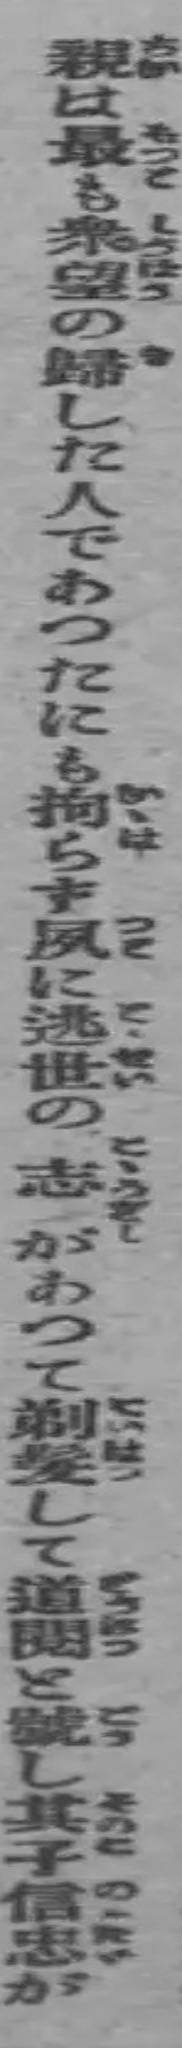親は最も衆望の帰した人であつたにも拘らず夙に逃世の志があつて剃髪して道閲と号し其子信忠が
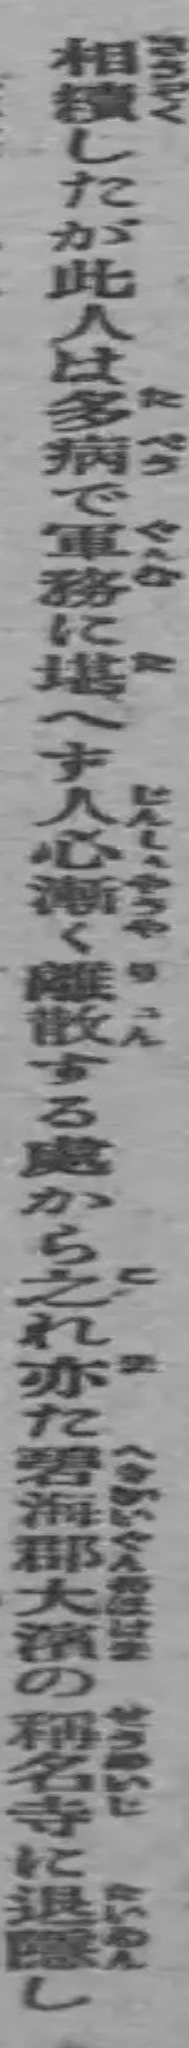相続したが此人は多病で軍務に堪へず人心漸く離散する処から之れ亦た碧海群大浜の称名寺に退隠し
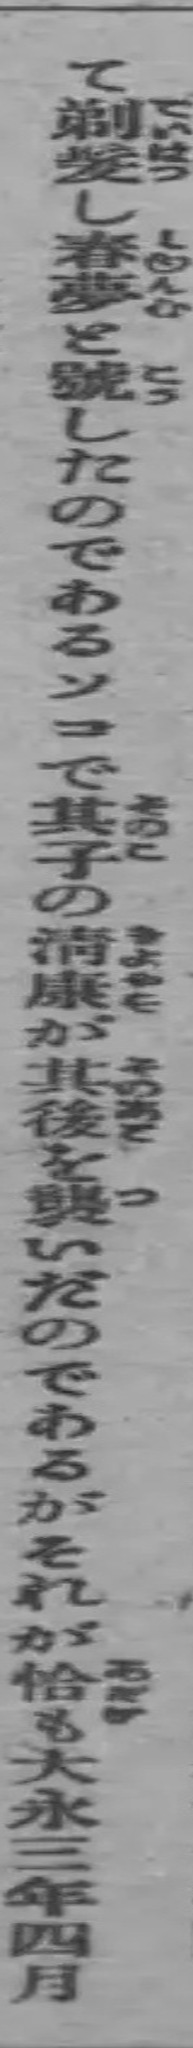て剃髪し春夢と号したのであるソコで其子の清康が其後を襲いだのであるがそれが恰も大永三年四月
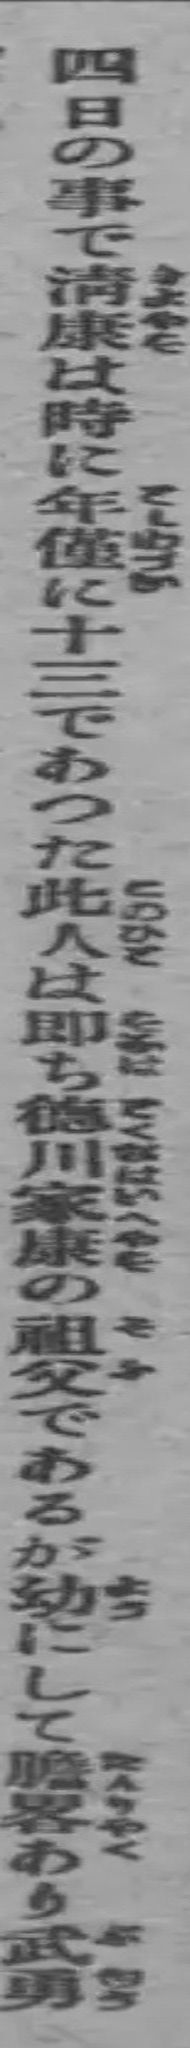松平清康四日の事で清康は時に年僅に十三であつた此人は即ち徳川家康の祖父であるが幼にして胆略あり武勇
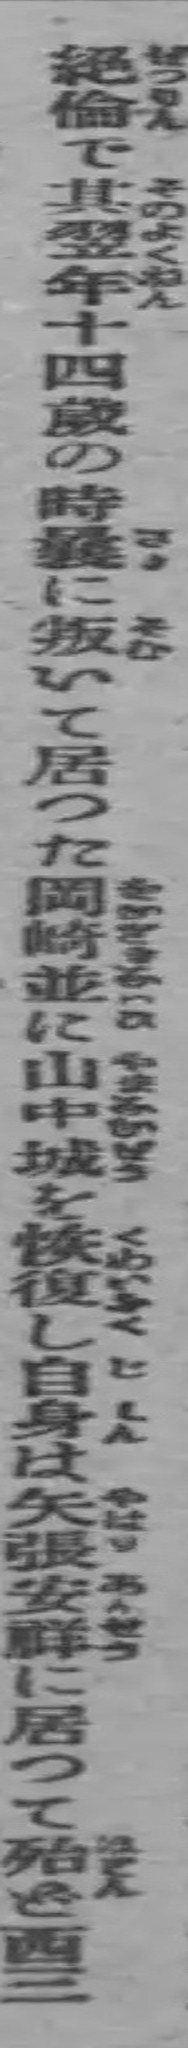絶倫で其翌年十四歳の時曩に叛いて居つた岡崎並に山中城を快復し自身は矢張安祥に居つて殆ど西三
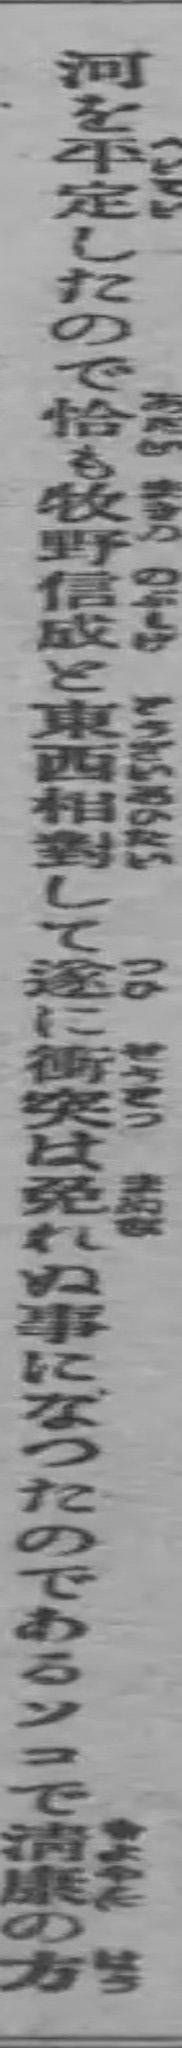河を平定したので恰も牧野信成と東西相対して遂に衝突は免れぬ事になつたのであるソコで清康の方
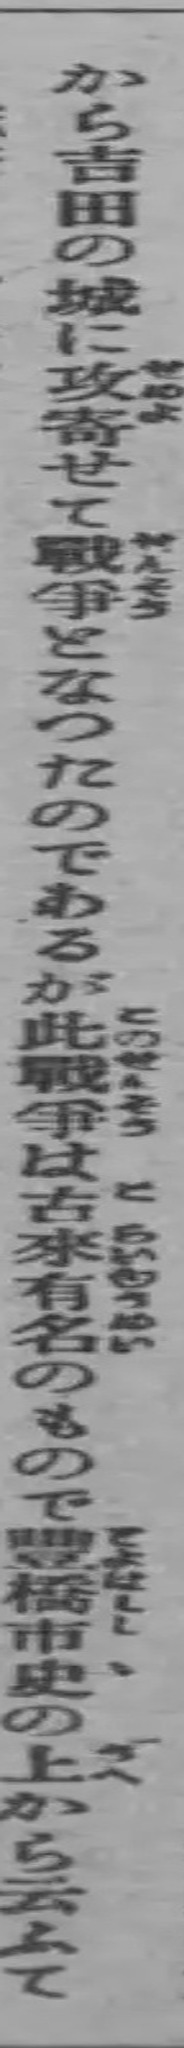から吉田の城に攻寄せて戦争となつたのであるが此戦争は古来有名のもので豊橋市史の上から云ふて
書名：豊橋市史談
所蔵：国立国会図書館 National Diet Library, JAPAN
